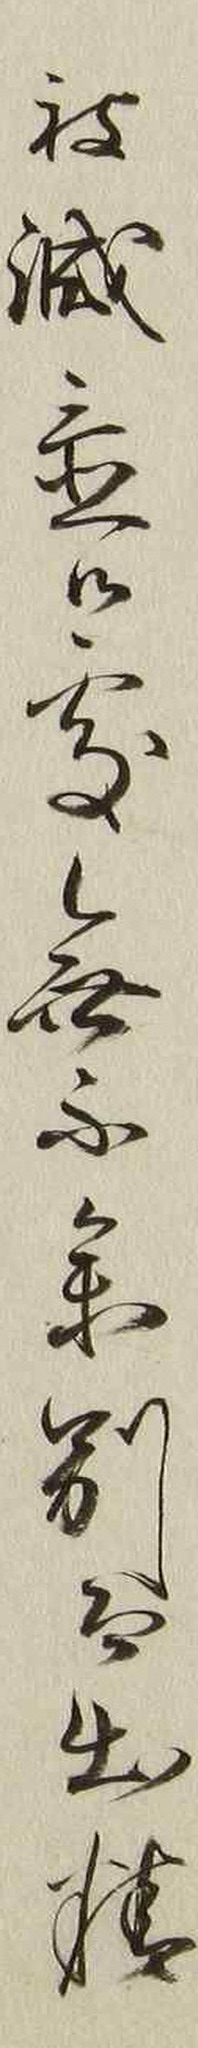被減置候処無不参別而出精
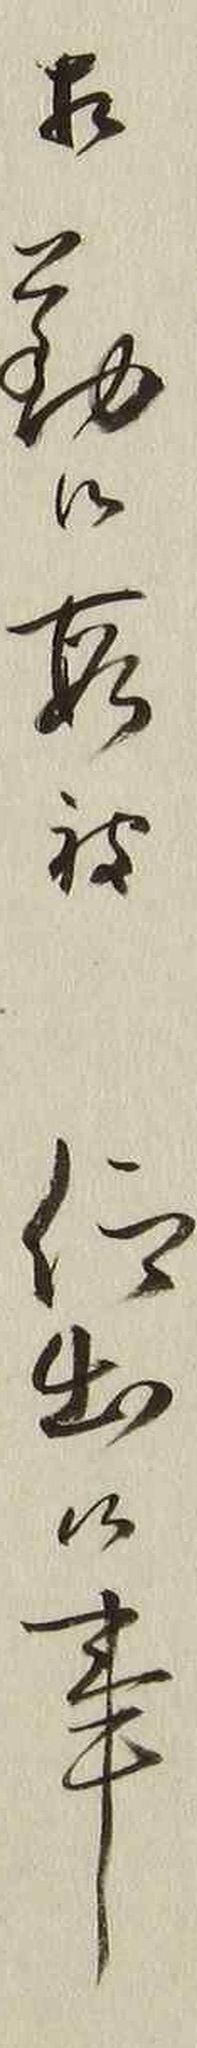相務候段被仰出候事
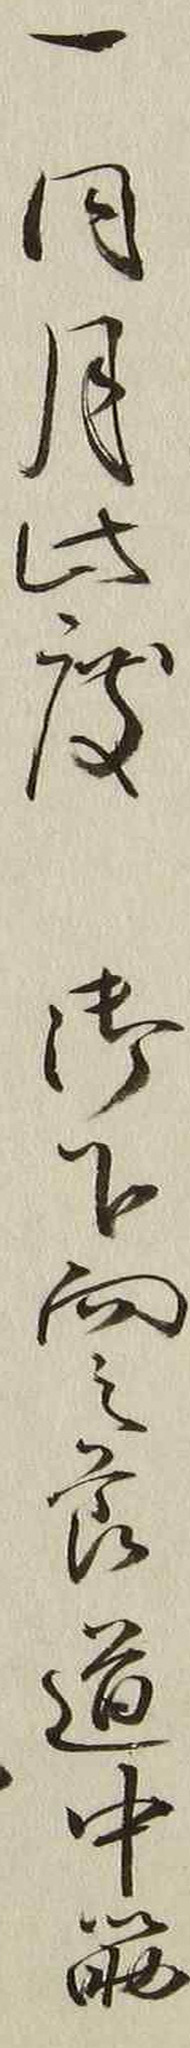一同月此度御下向之節道中筋
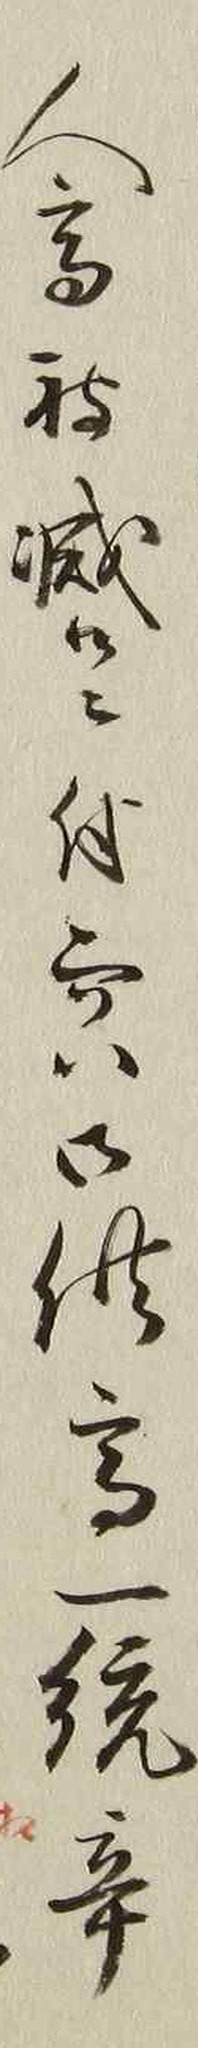人高被減候ニ付而は御供高一統辛
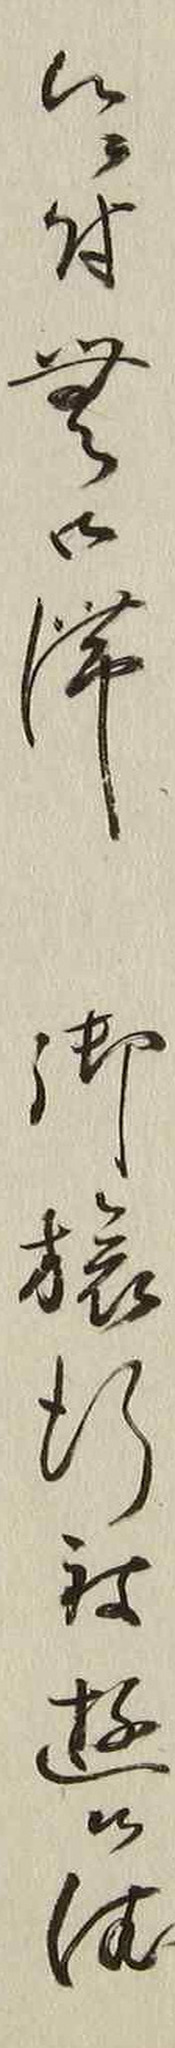候ニ付無御滞御旅行被遊候依
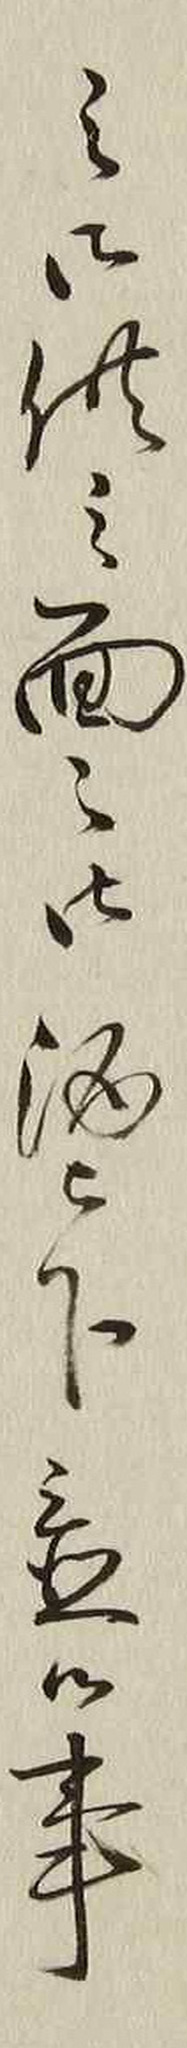之御供之面々御酒被下置候事
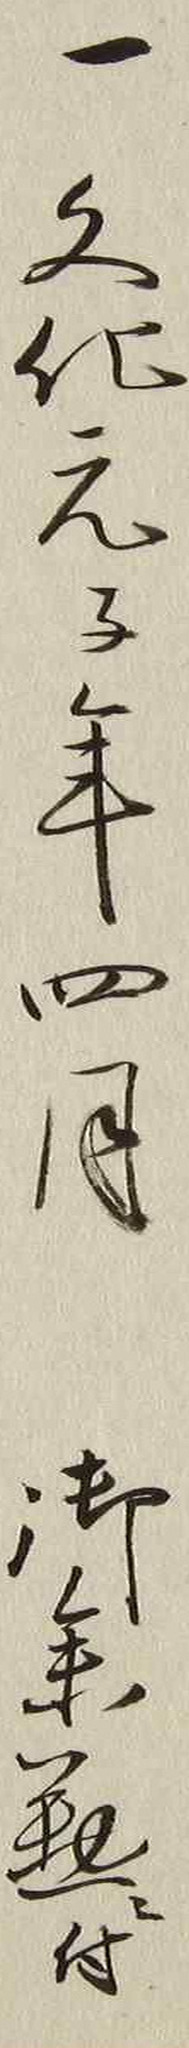一文化元子年四月御参懃ニ付
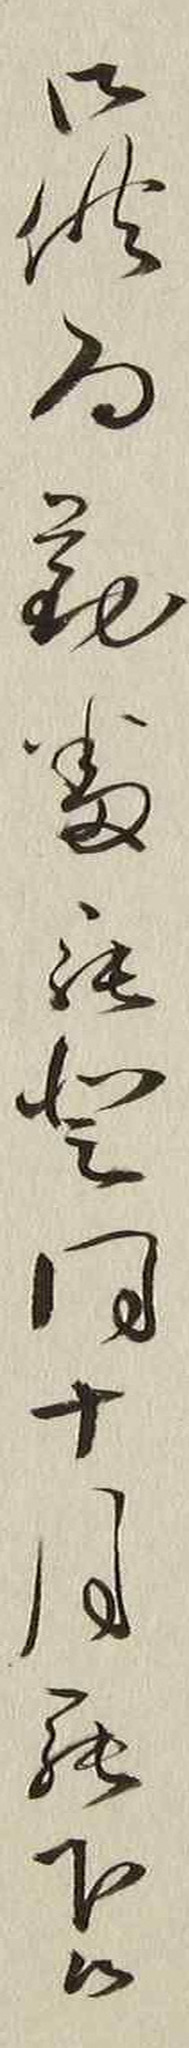御供為勤番罷登同十月罷下候
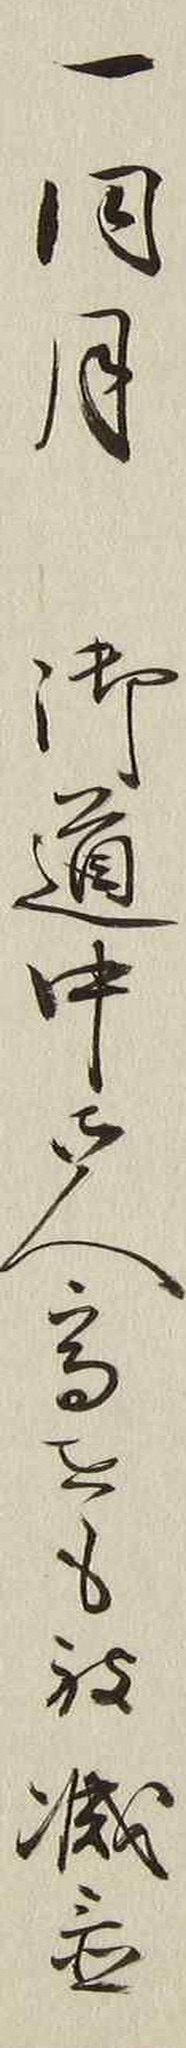一同月御道中御人高をも被減置
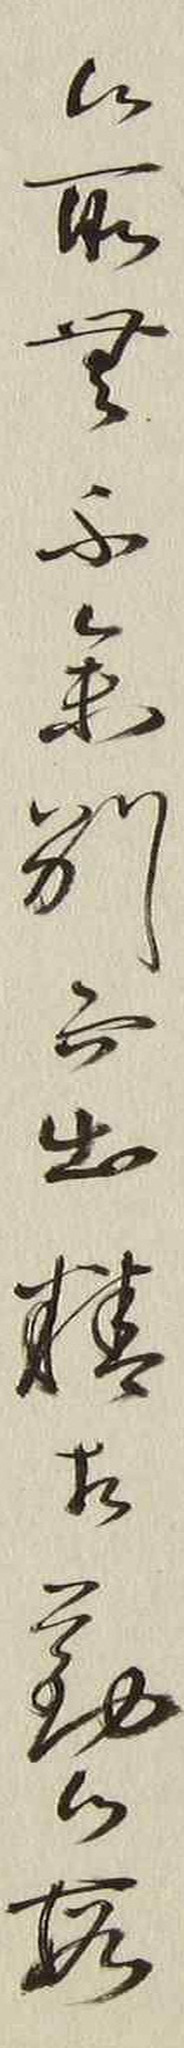候所無不参別而出精相勤候段
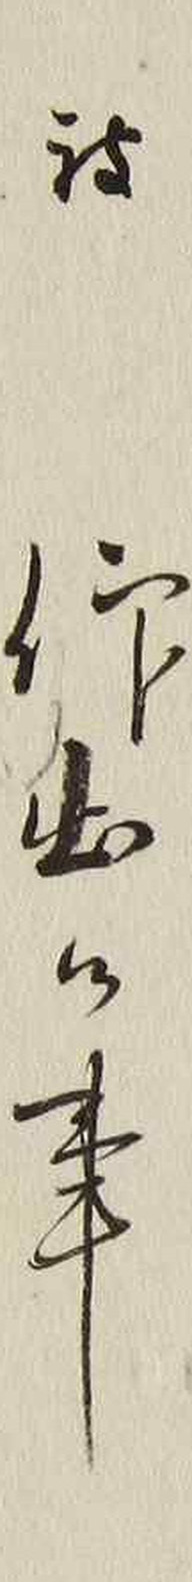被仰出候事
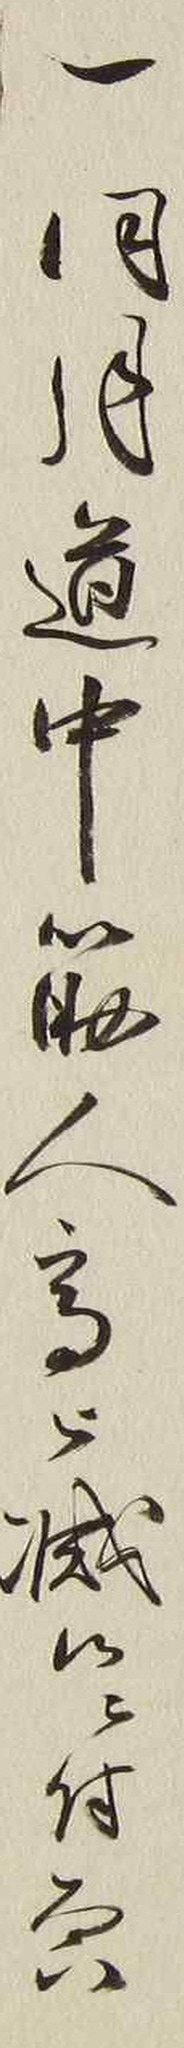一同月道中筋人高被減候ニ付而は
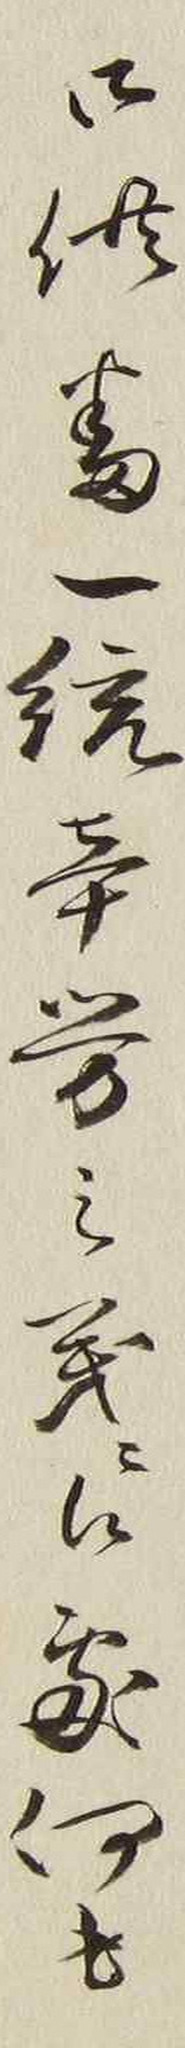御供番一統辛労之義ニ候処何も
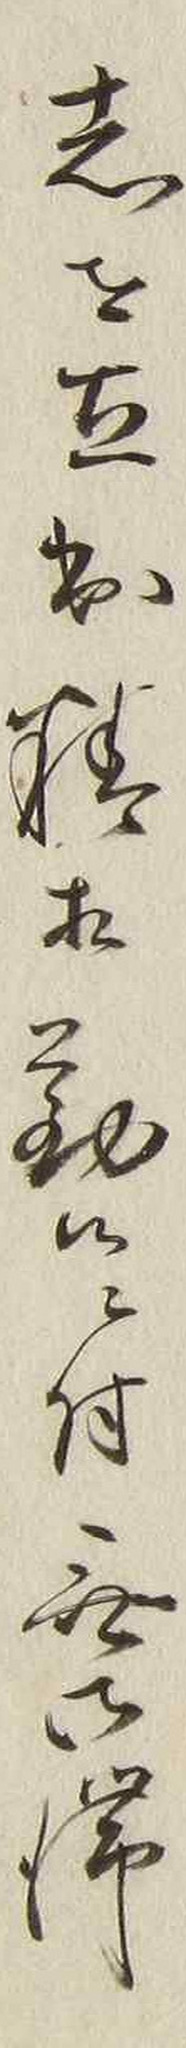志を立出精相勤候ニ付無御滞

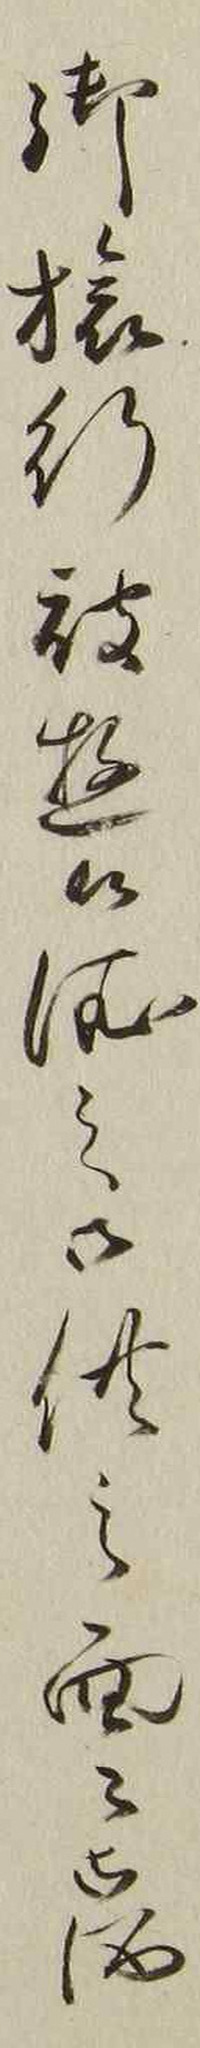御旅行被遊候依之御供之面々御酒
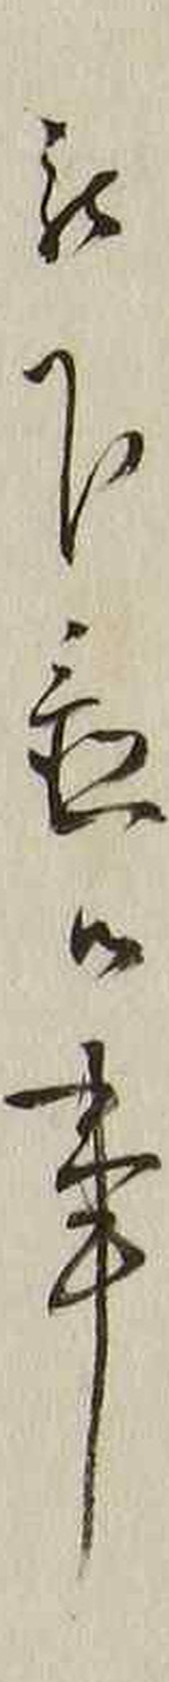被下置候事
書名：諸士系譜　巻之163　な之部5
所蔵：会津若松市立会津図書館
